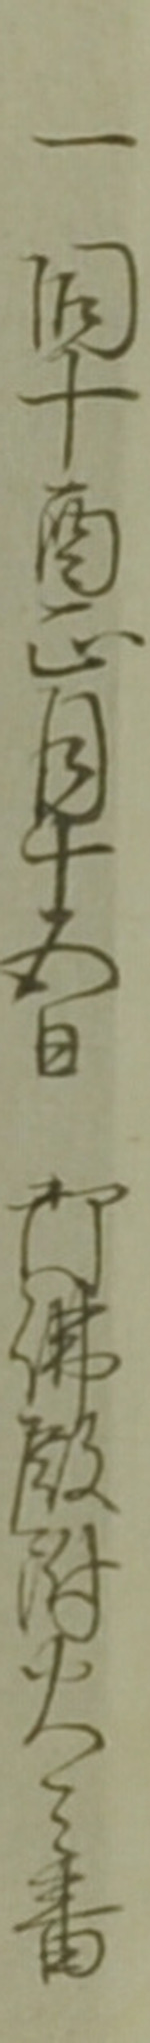一同十酉正月十五日御仏殿附火之番
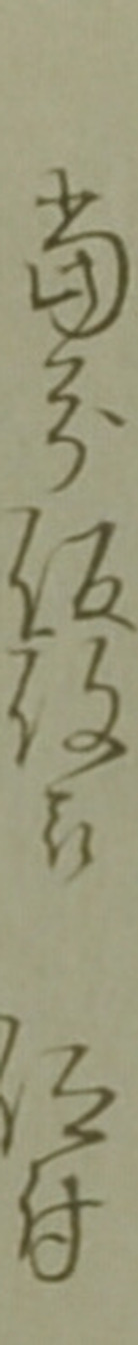当分仮役被仰付
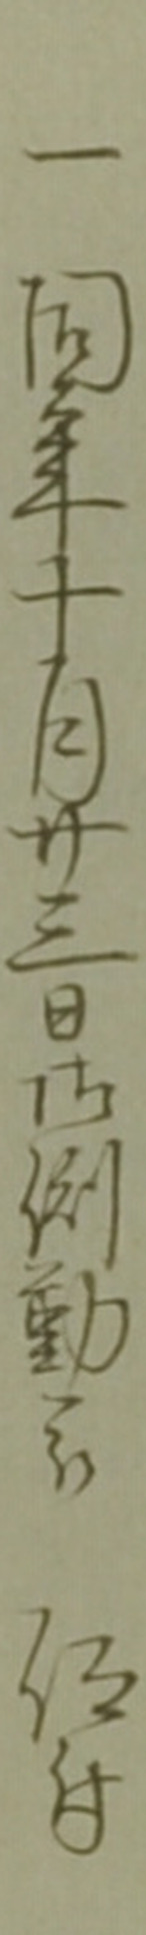一同年十月廿三日御側勤被仰付
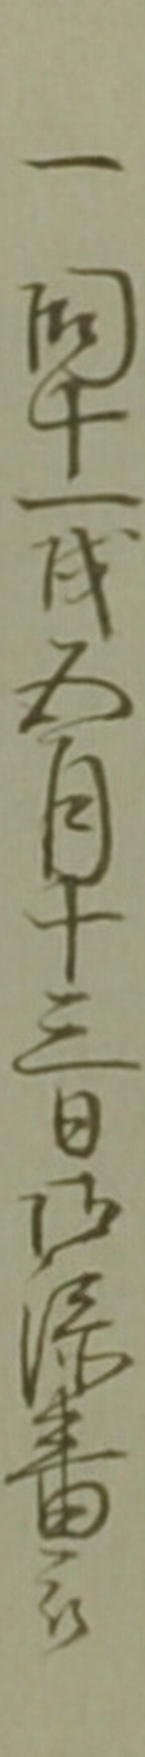一同十一戌五月十三日御添番被
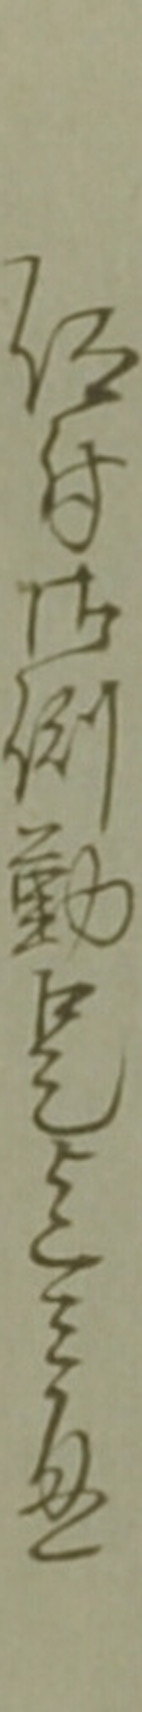仰付御側勤是迄之通
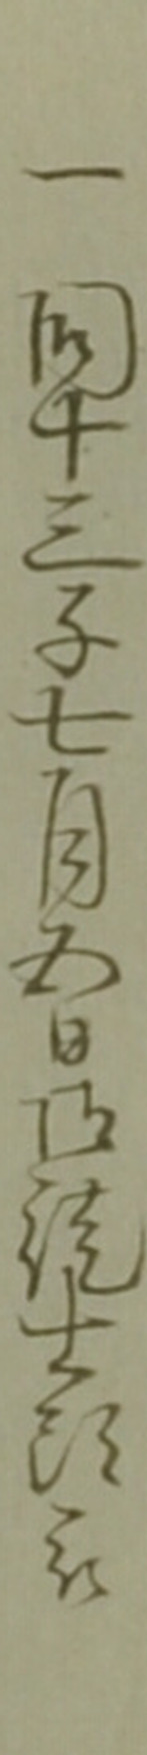一同十三子七月五日御徒士頭被
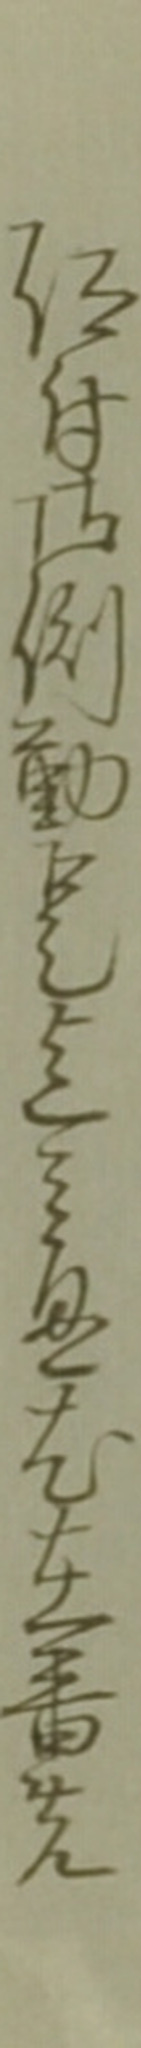仰付御側勤是迄之通尤在番先
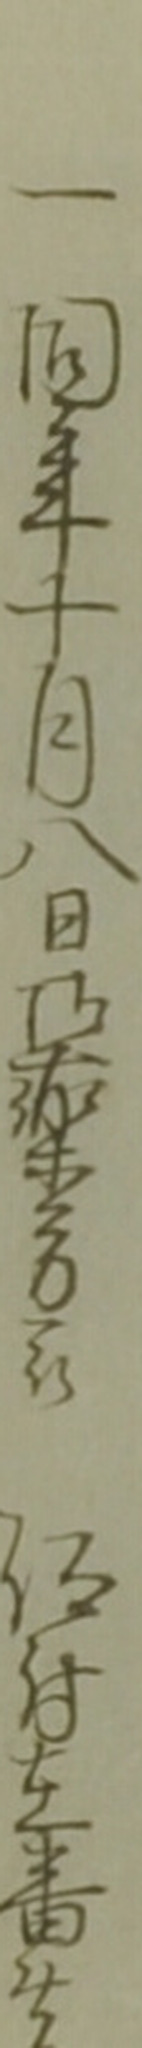一同年十月八日御薬方被仰付在番先
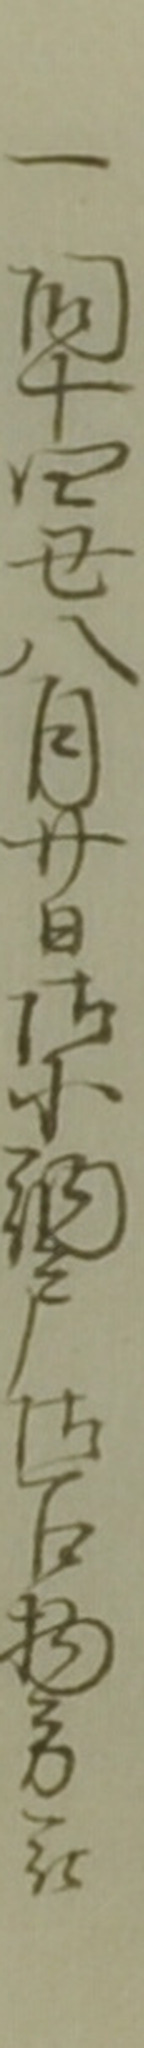一同十四丑八月廿日御小納戸御召物方被
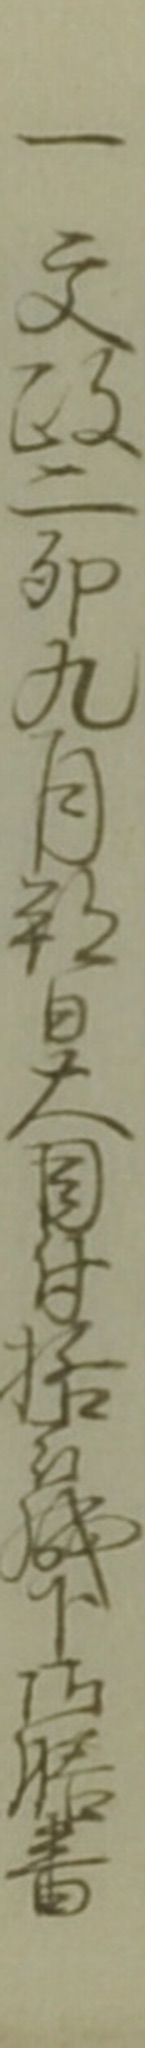一文政二卯九月朔日大目付格被成下御膳番
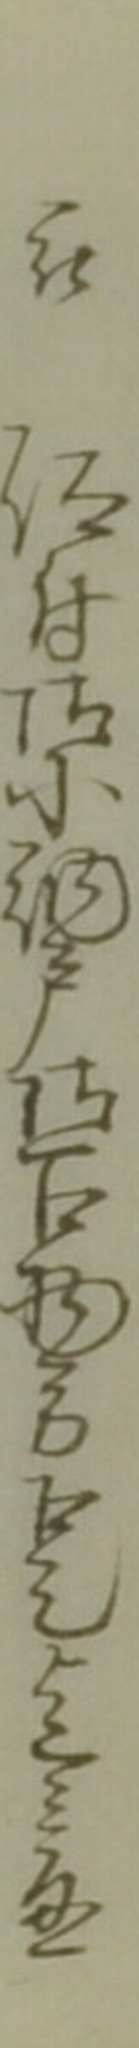被仰付御小納戸御召物方是迄之通
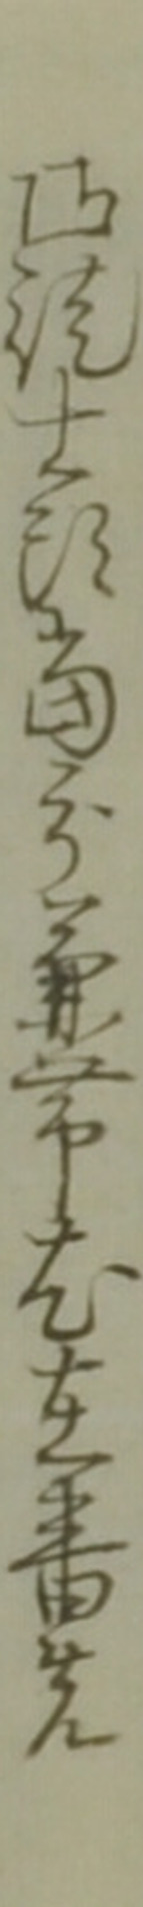御徒士頭当分兼帯尤在番先
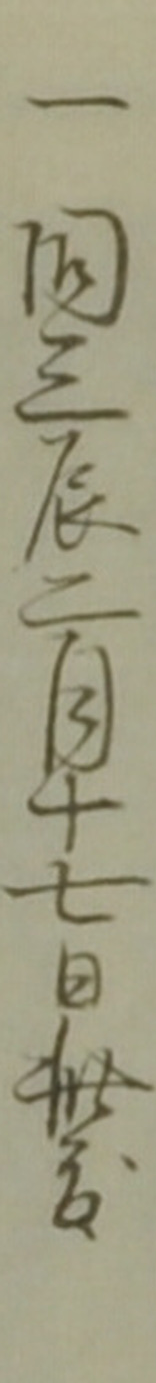一同三辰二月十七日此度
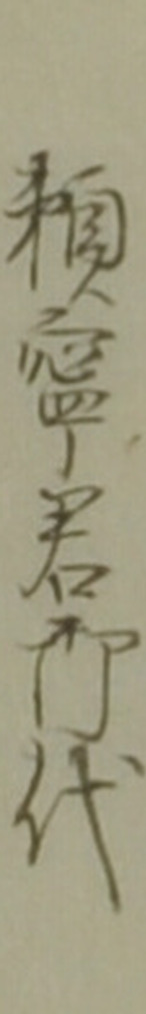頼寧君御代
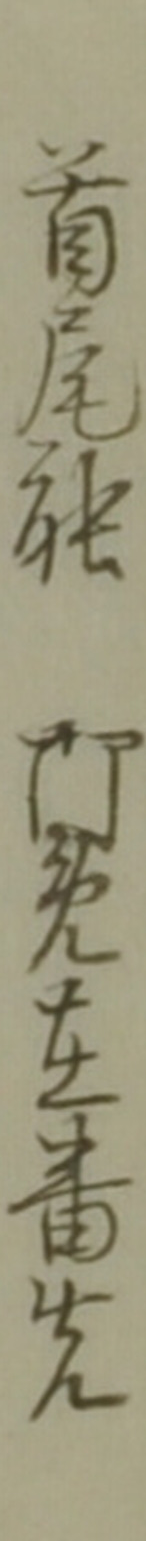首尾能御免在番先
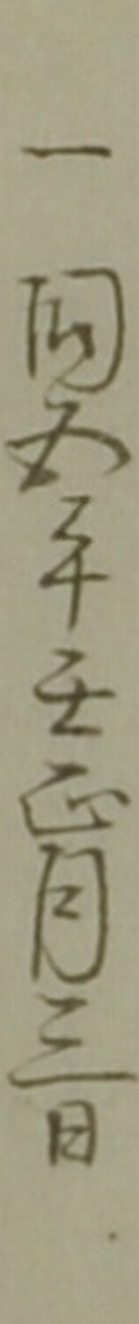一同五午閏正月三日
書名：給人諸士勤仕録（三）
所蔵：伊那市立高遠町図書館・合同会社AMANE
